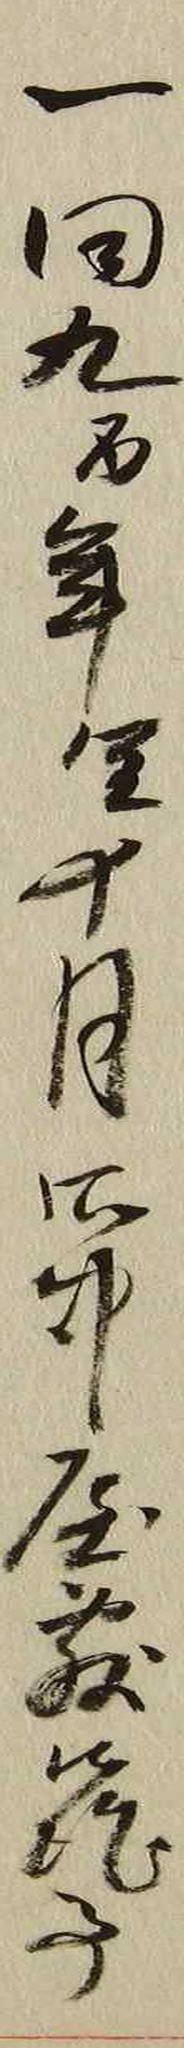一同九酉年閏十月御中屋敷御作事
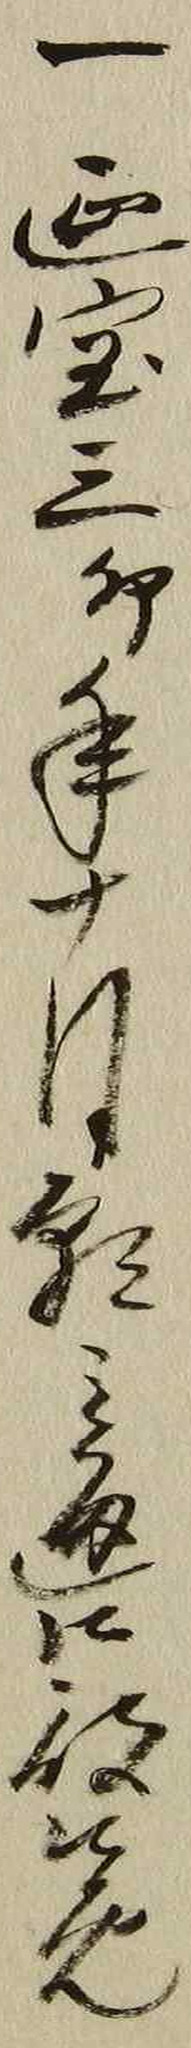一延宝三卯年十月願之通御役御免
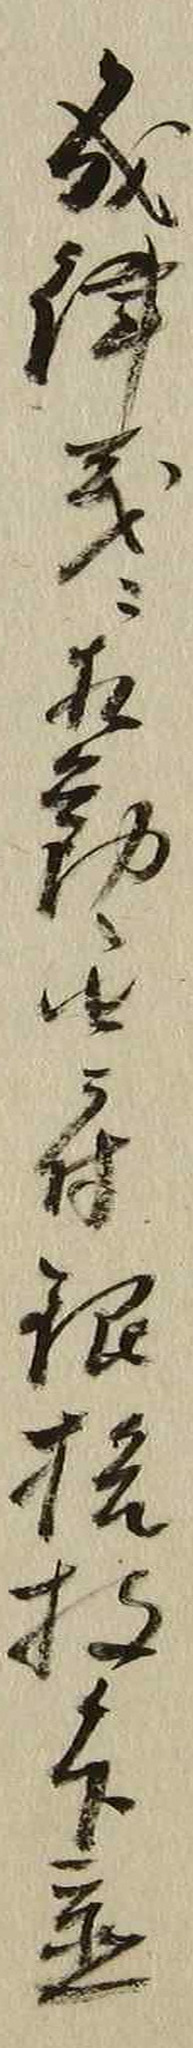被成律義ニ相勤候由ニ付銀拾枚被下置
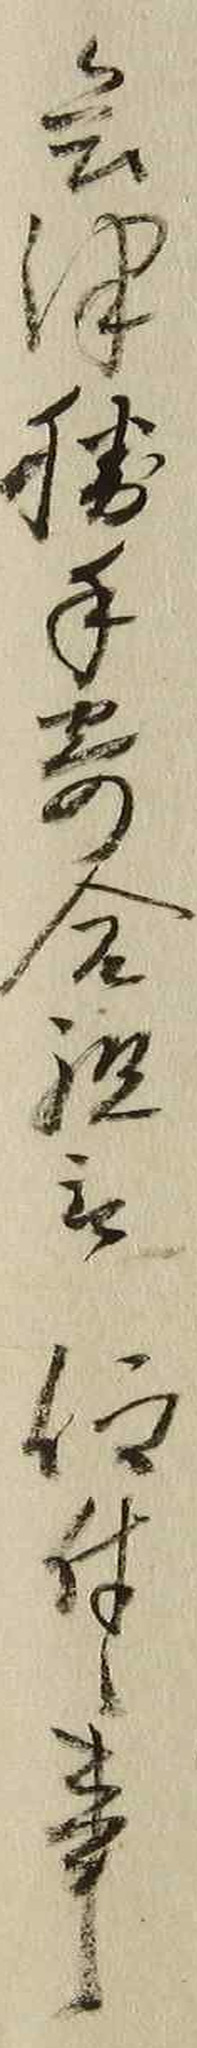会津勝手寄合組被仰付候事
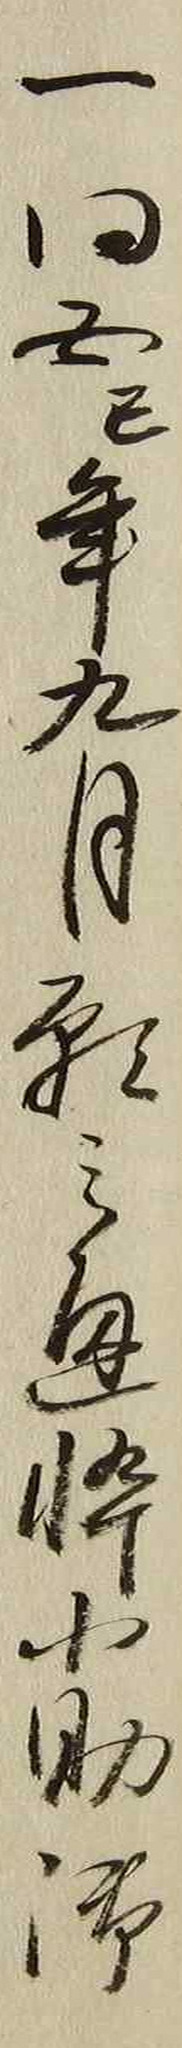一同五巳年九月願之通忰小助御
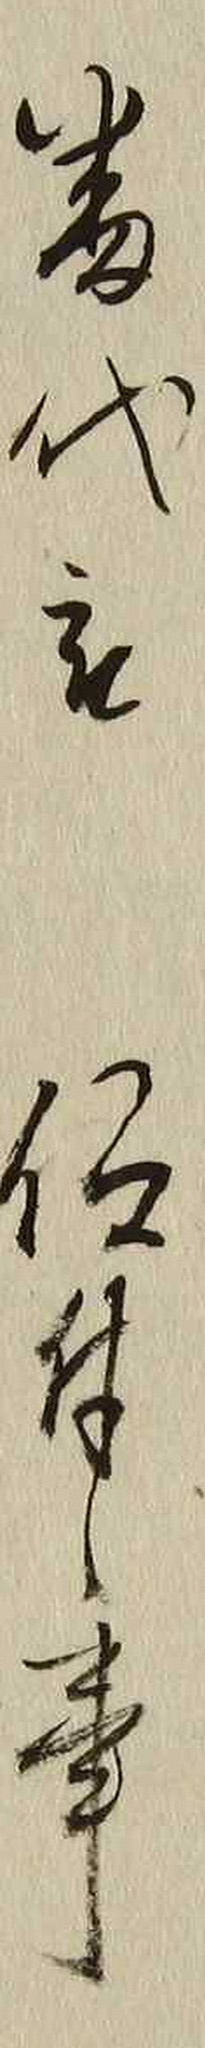番代被仰付候事
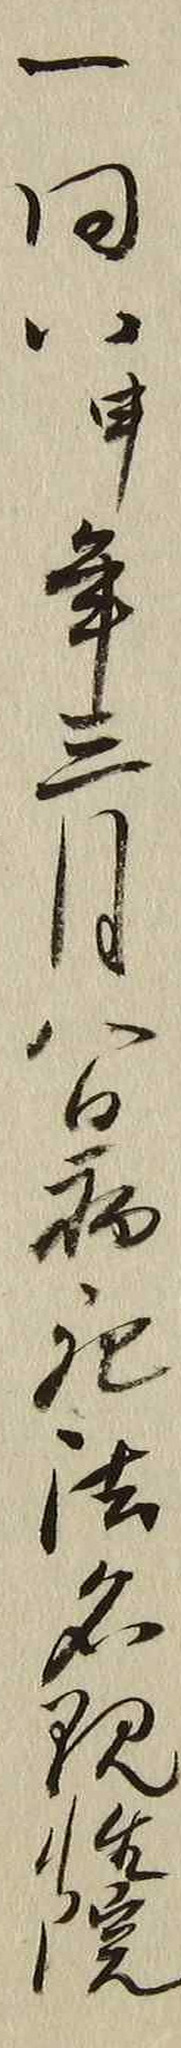一同八申年三月八日病死法名現性院
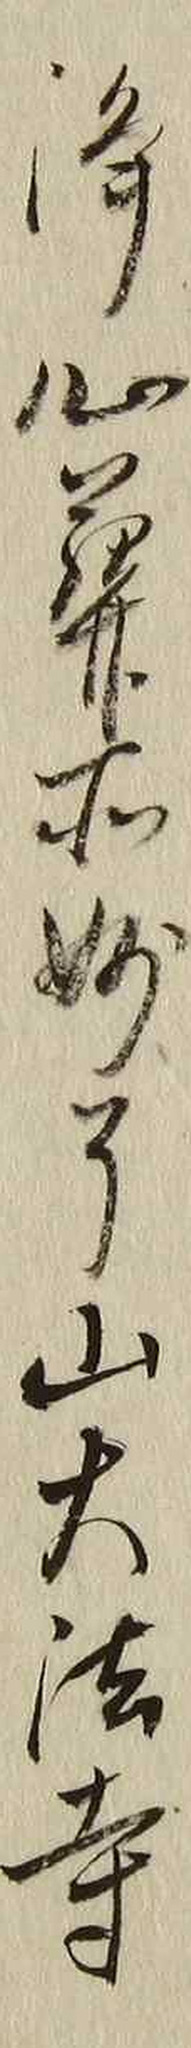浄心葬所妙了山大法寺
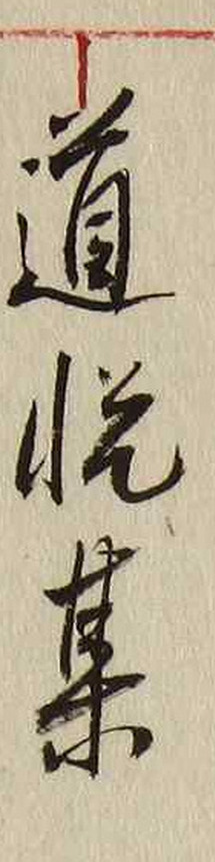道悦某
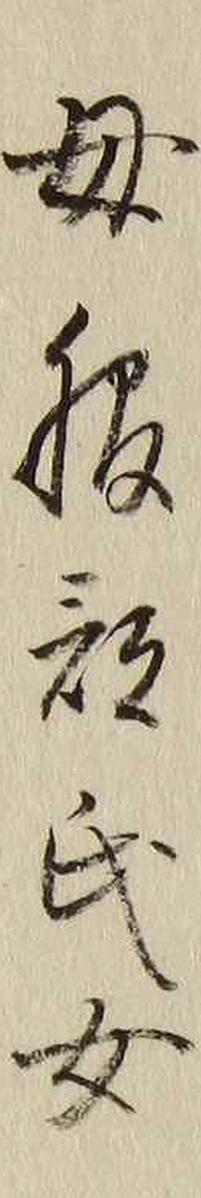母服部氏女
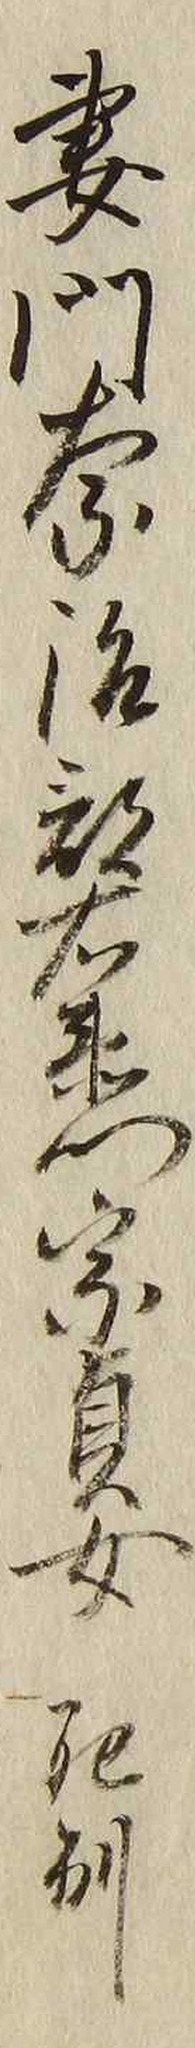妻門奈治部右衛門宗貞女死別

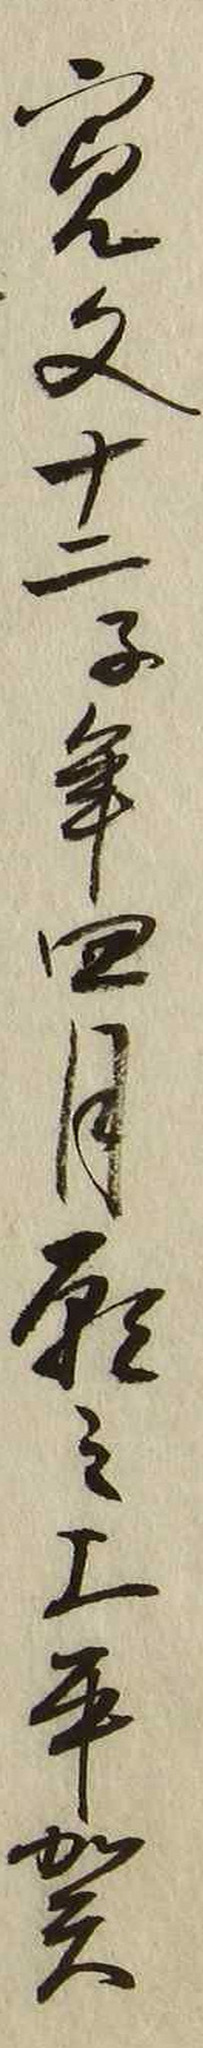寛文十二子年四月願之上平賀
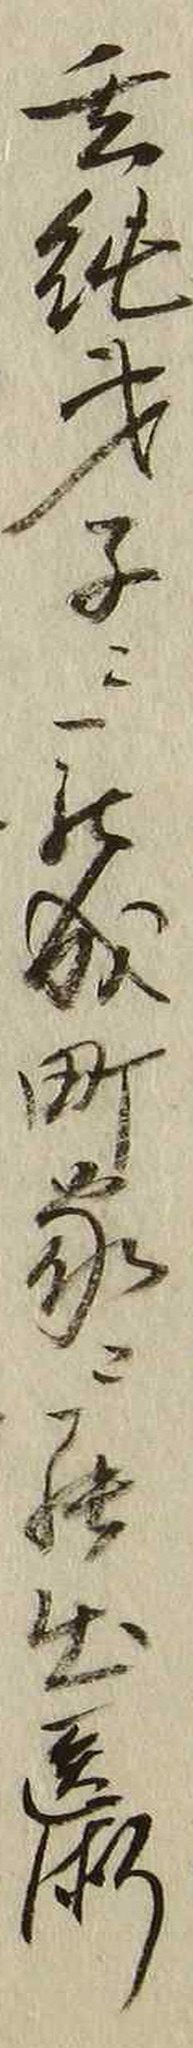玄純弟子ニ罷成町家ニ罷出医術
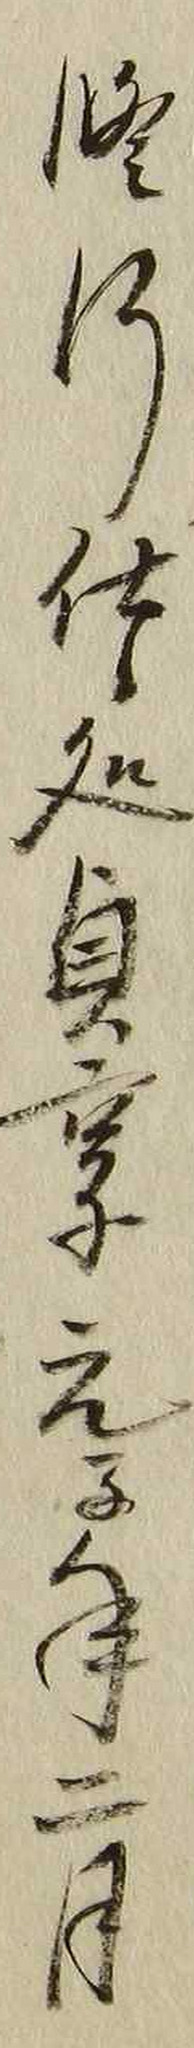修行仕候処貞享元子年二月
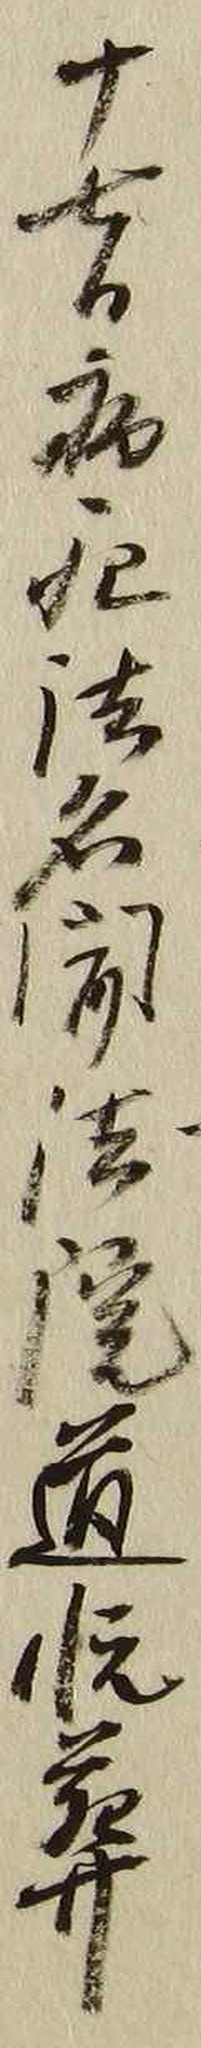十七日病死法名聞法院道悦葬
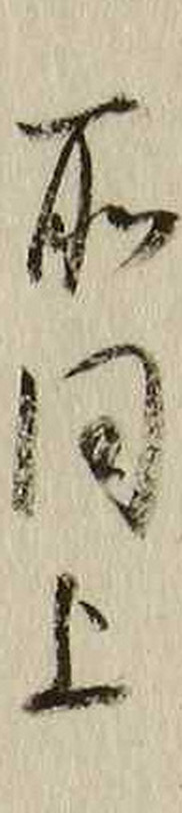所同上
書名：諸士系譜　巻之352　す之部2
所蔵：会津若松市立会津図書館
